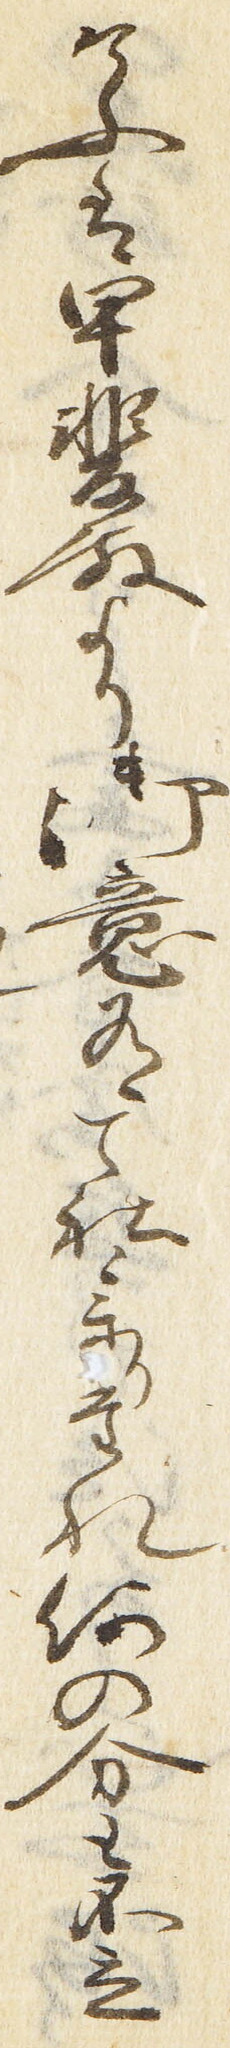けふは甲斐殿より御意有て社参りたれ何の分も不立
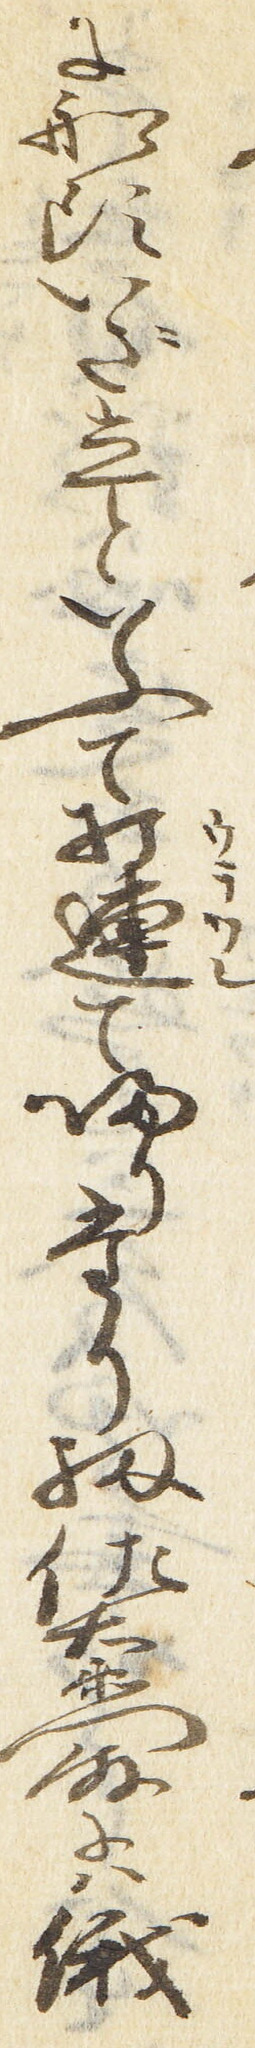に船頭いざ立といふて打連て帰りたり扨佐右衛門殿には俄
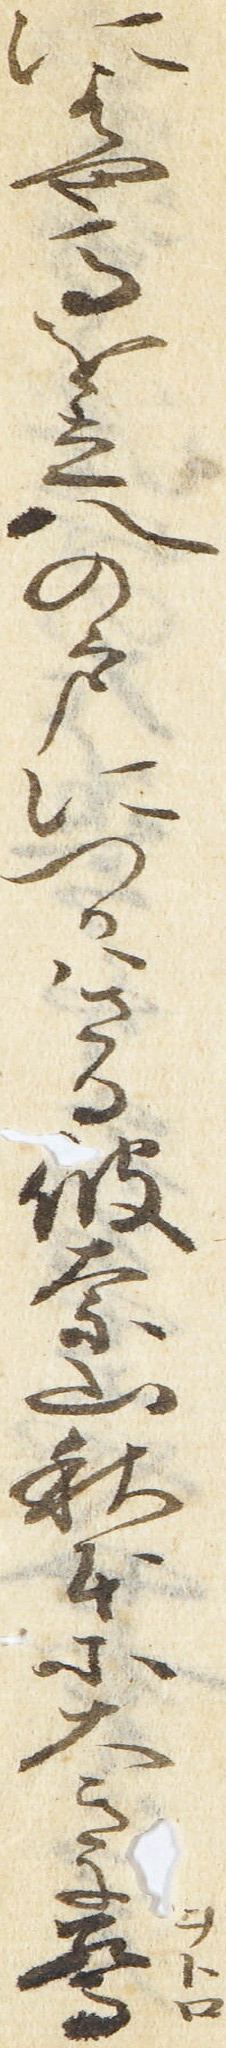にはや馬を立八の戸につかはさる彼奈山秋本等大きに驚
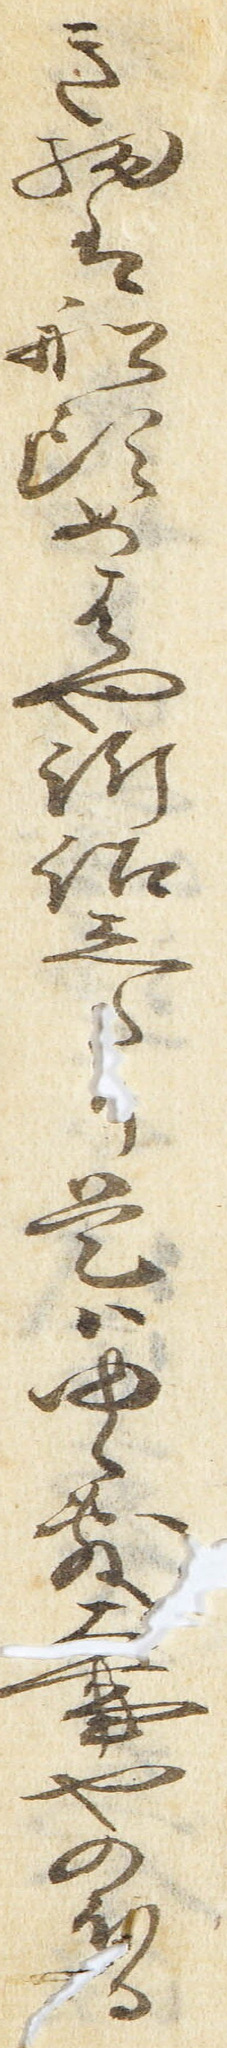き扨は船頭めはや訴訟したり是はゆゝ敷大事也のほる

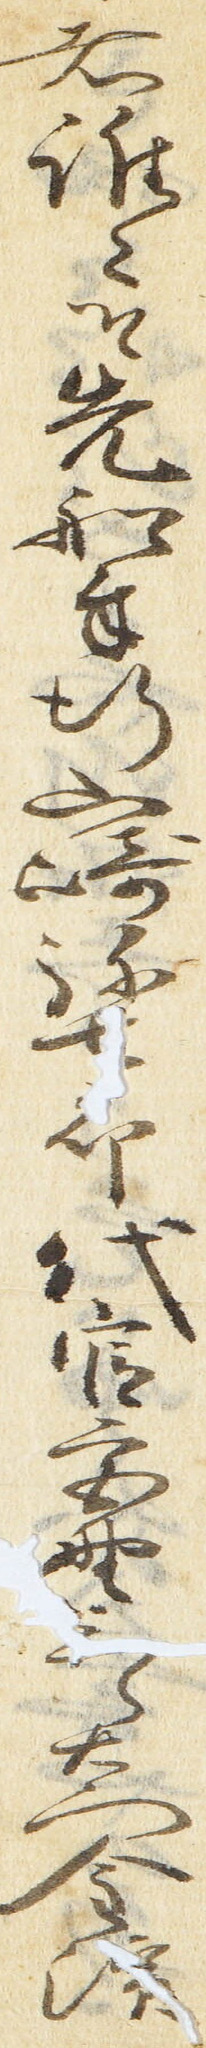者誰々そ先船奉行山崎弥七郎代官宮野三郎右衛門金浜
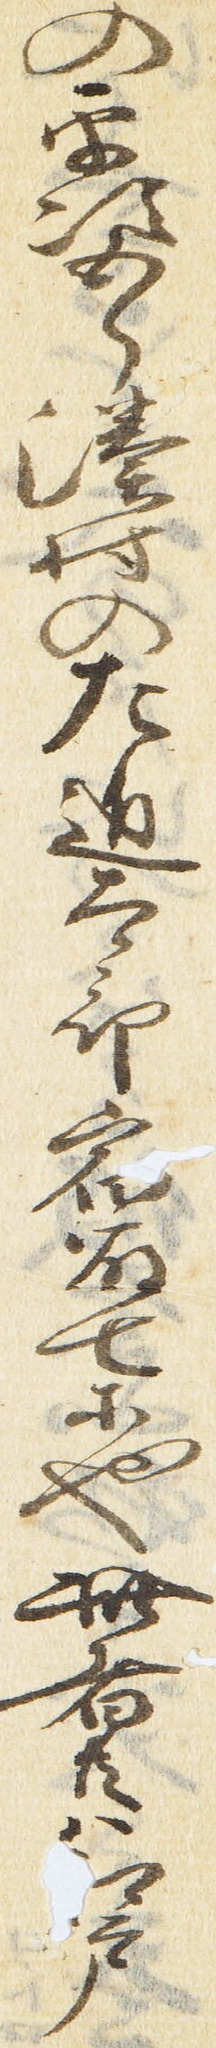の平次五郎湊村の左近太郎宿藤七等也此者共は江戸
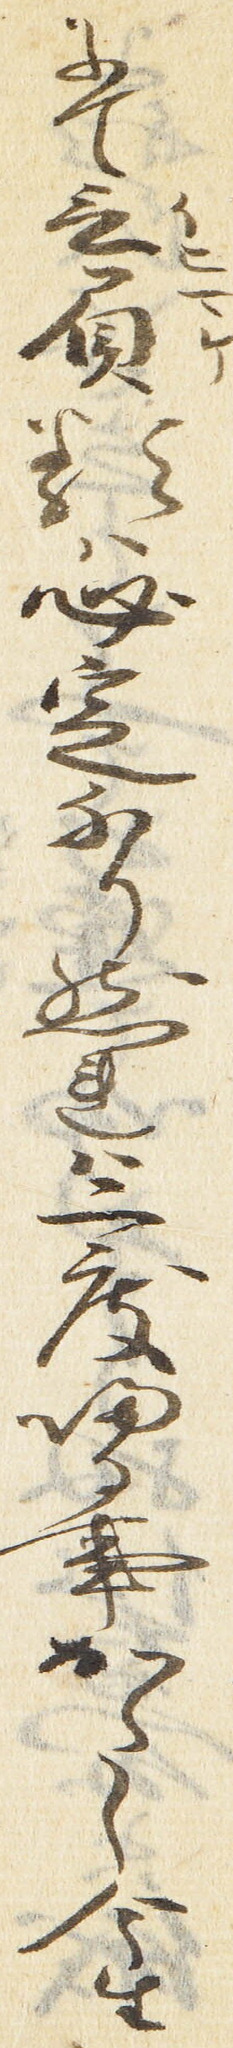にて言負るは必定なり然れは二度帰る事かたし今生
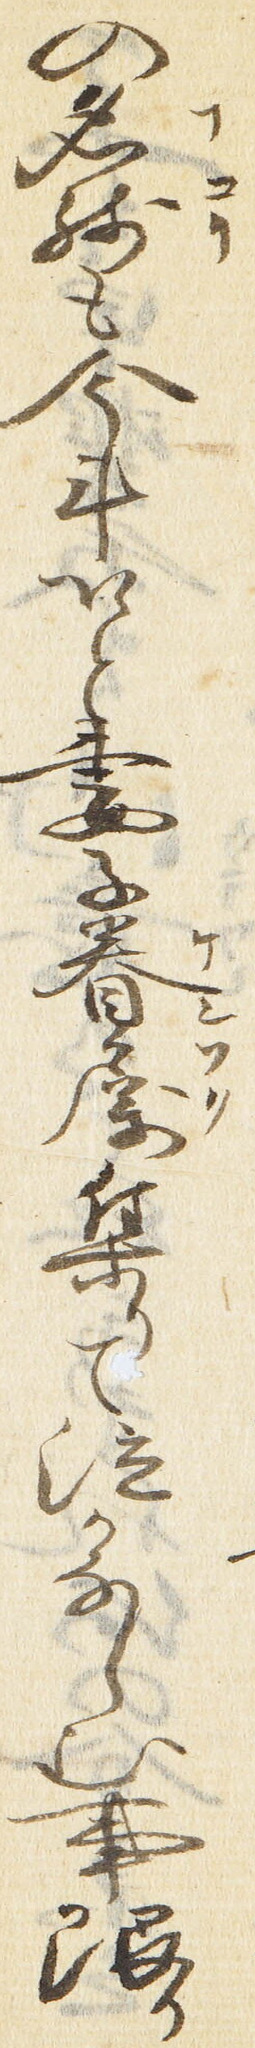の名残も今斗そと妻子眷属集りて泣かなしむ事限り
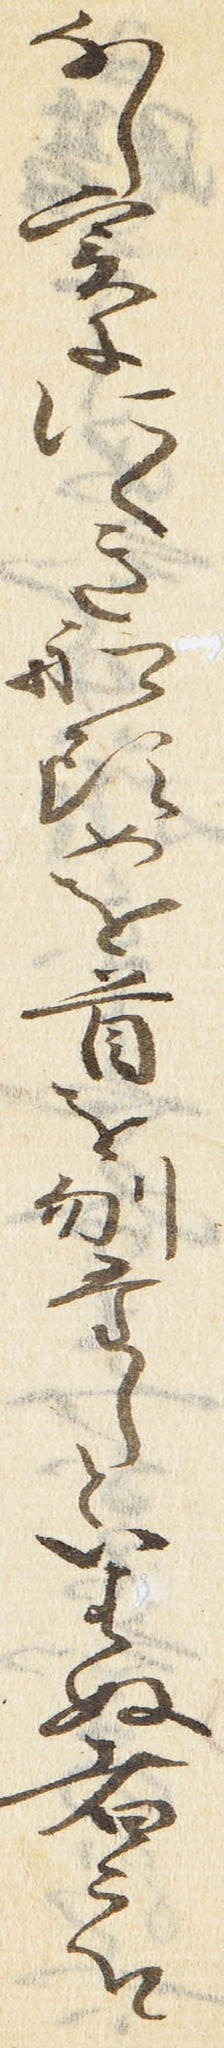なし実ににくき船頭めを首を刎たしといはぬ者こそ
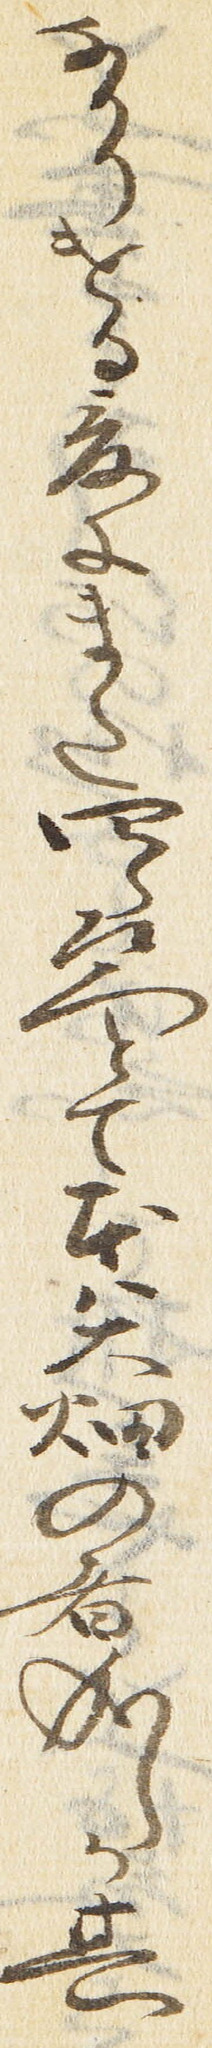なかりける爰にまた四郎左衛門とて本は大畑の者成しか其
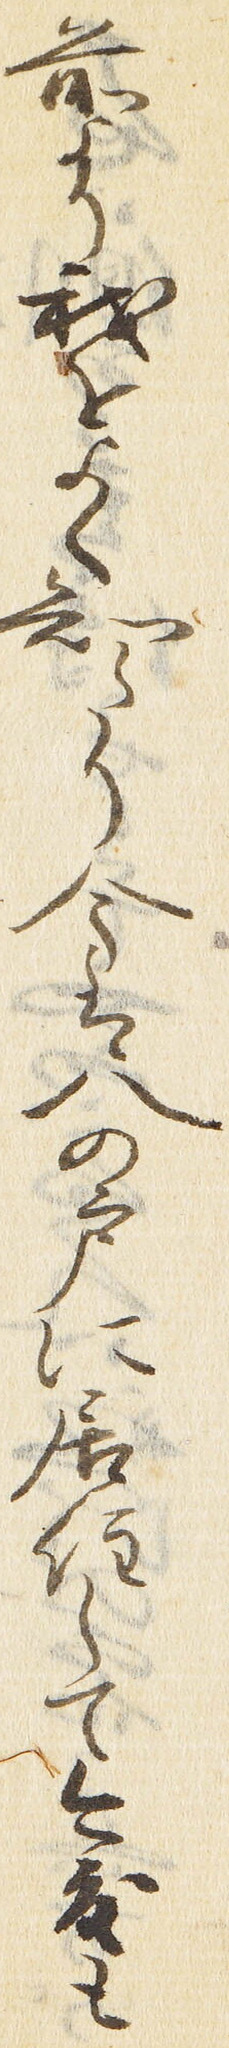前より我をよく知たり今は八の戸に居住して今度も
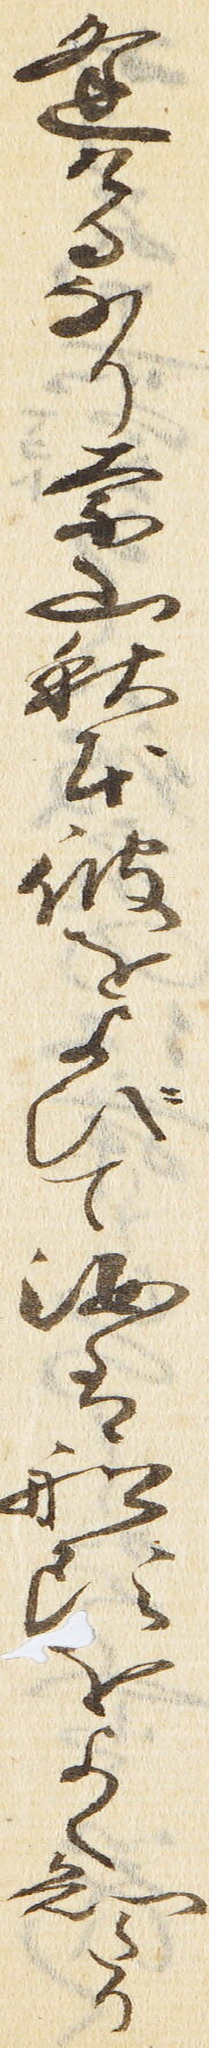逢けるなり奈山秋本彼をよびて汝は船頭をよく知たり
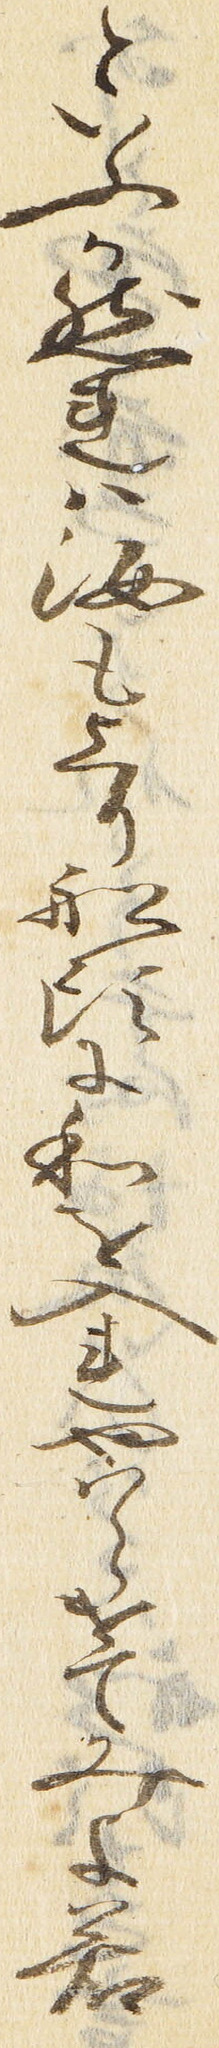といふか然れは汝も上り船頭に和を入れやはらけみよ若
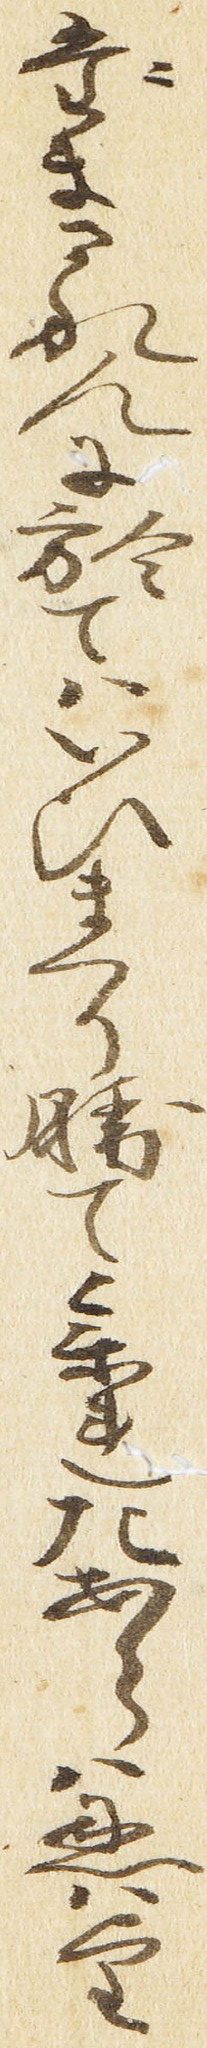だまされんに於てはいひまつり勝て参れ左あらは恩は望
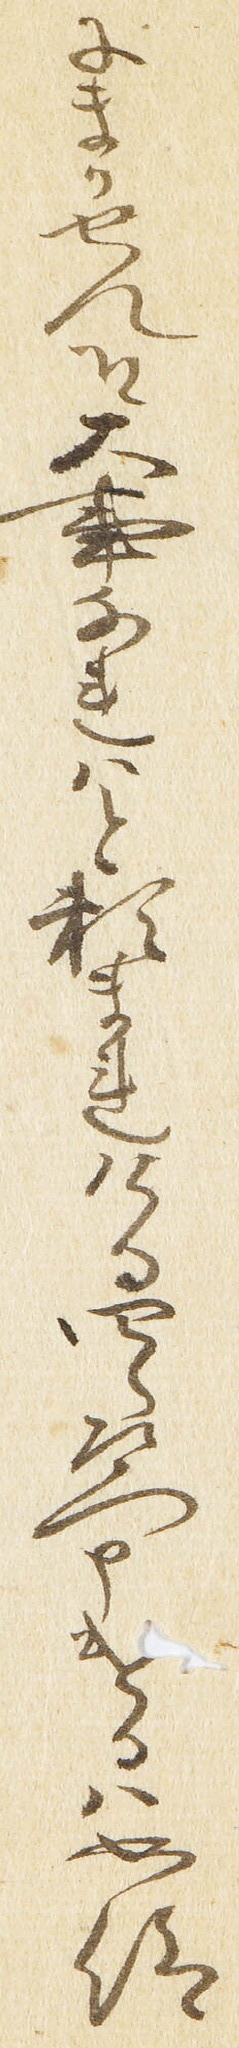にまかせんそ大事なれはと頼まれける四郎左衛門申けるは如仰
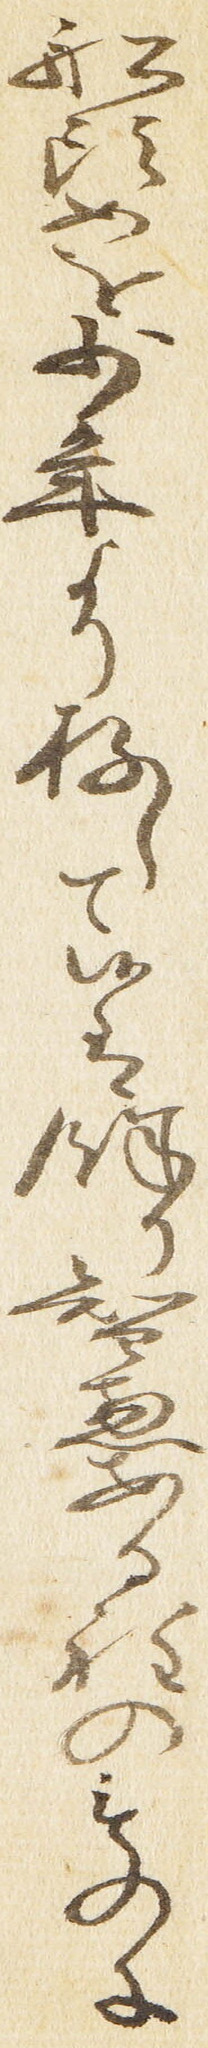船頭めを少年より存して候は余り智恵ある程のものに
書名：海陸世話日記
